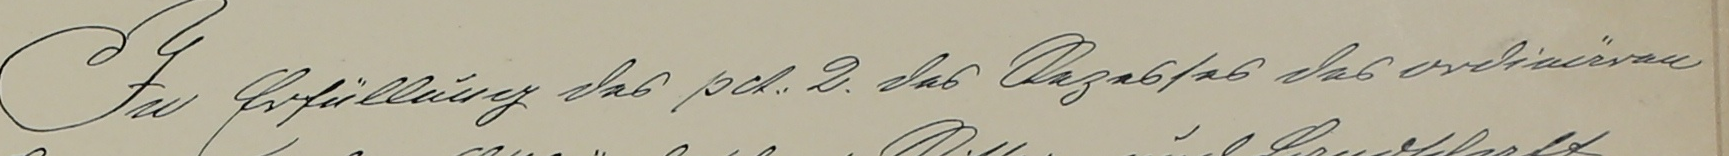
In Erfüllung des pct. 2 des Rezesses des ordinären
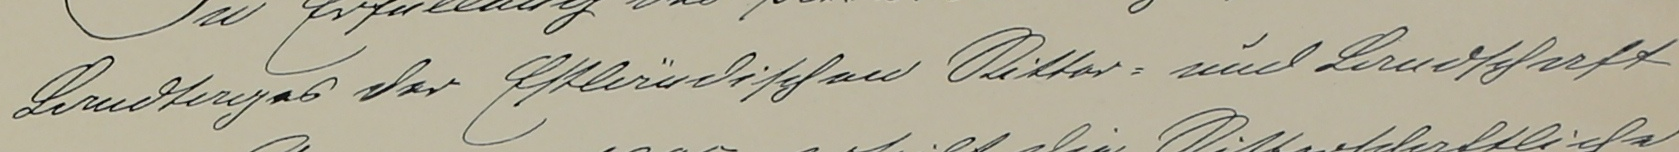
Landtages der Estländischen Ritter- und Landschaft
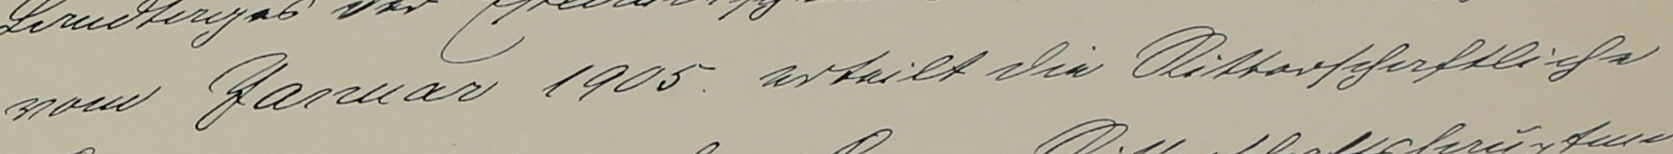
vom Januar 1905. erteilt die Ritterschaftliche
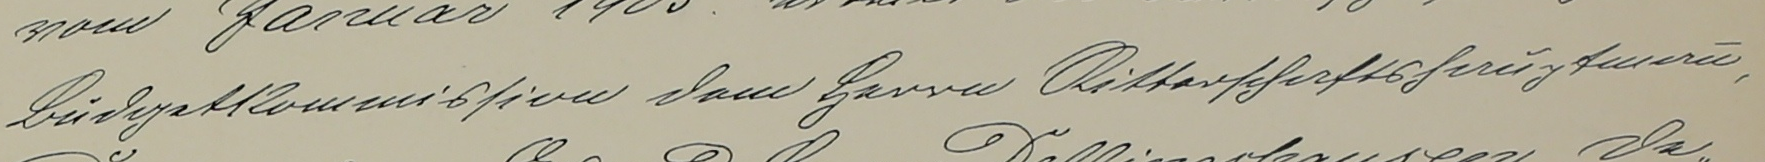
Budgetkommission dem Herrn Ritterschaftshauptmann,
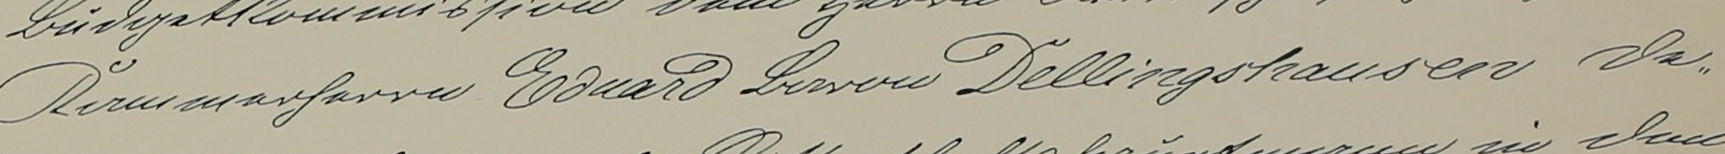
Kammerherrn Eduard Baron Dellingshausen De-
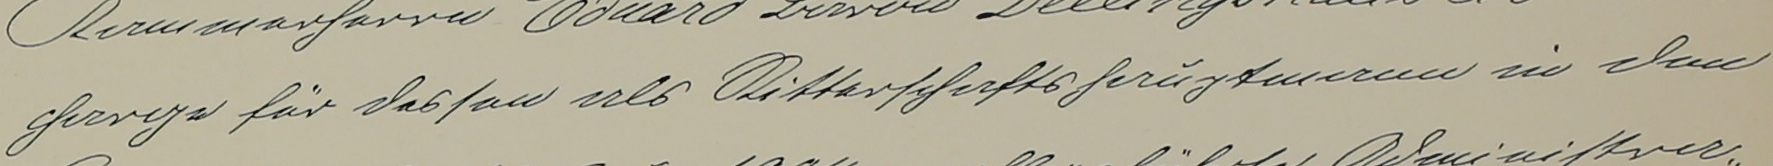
charge für dessen als Ritterschaftshauptmann in den
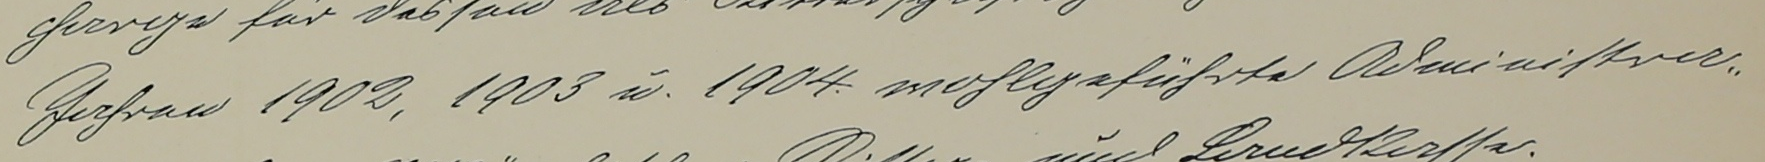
Jahren 1902, 1903 u. 1904. wohlgeführte Administra-
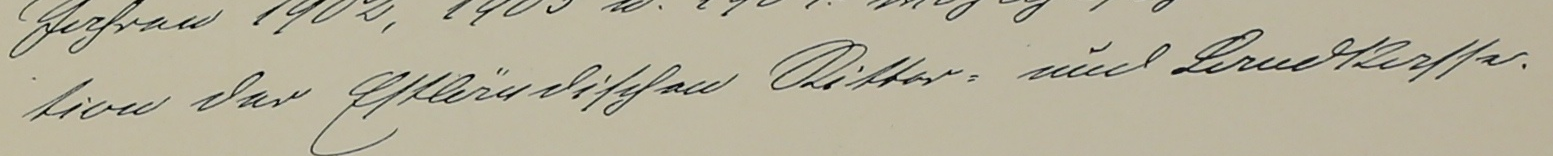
tion der Estländischen Ritter- und Landkasse.
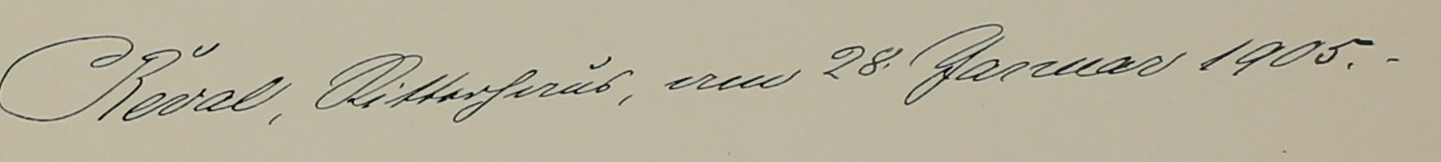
Reval, Ritterhaus, am 28. Januar 1905. -
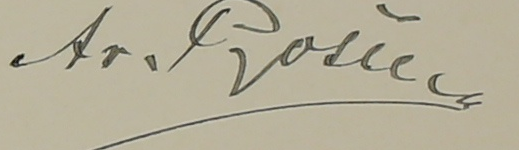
A. v. Rosen
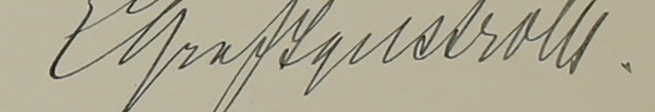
E. Graf Igelstrom
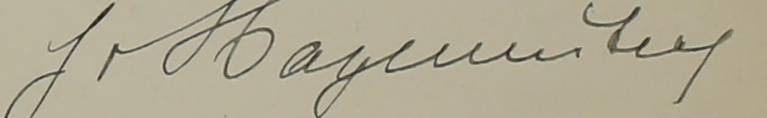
J. v. Hagemeister
